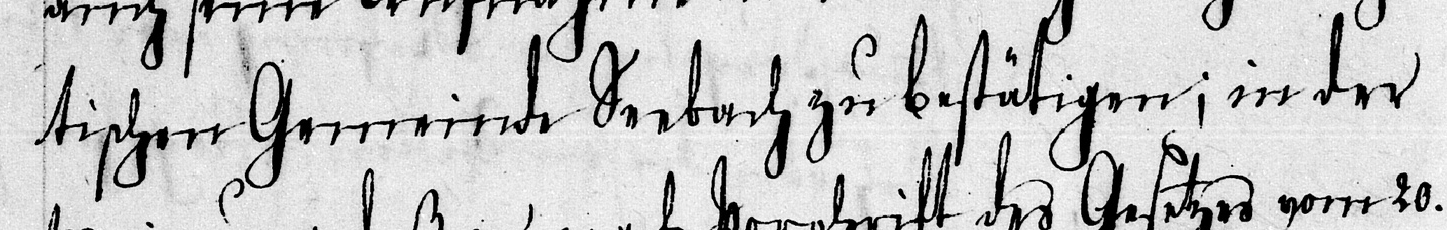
tischen Gemeinde Seebach zu bestätigen; in der
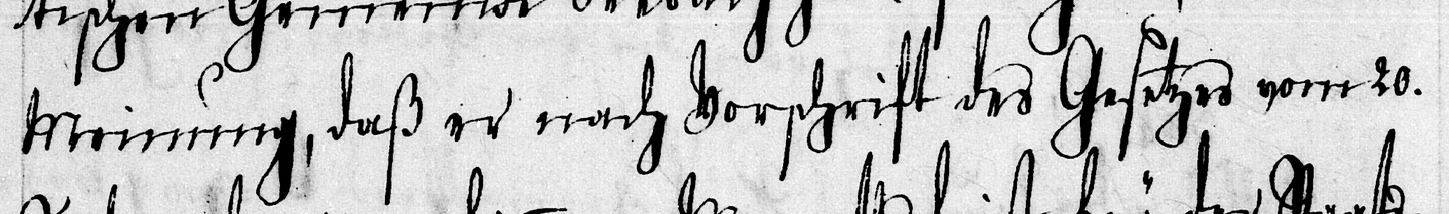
Meindung, daß er nach Vorschrift des Gesetzes vom 20.
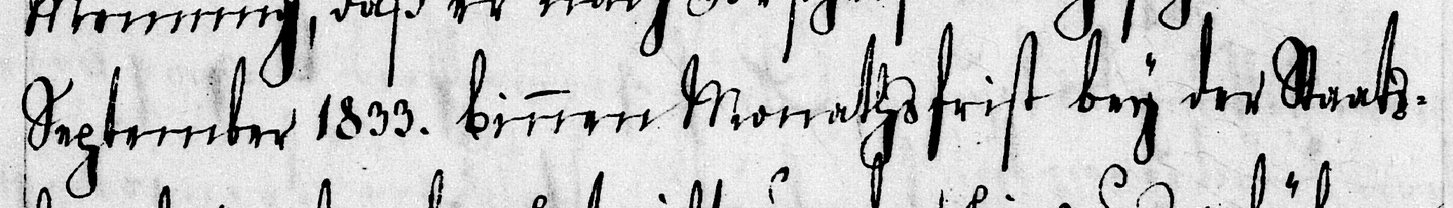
September 1833. binnen Monathsfrist bey der Staats¬
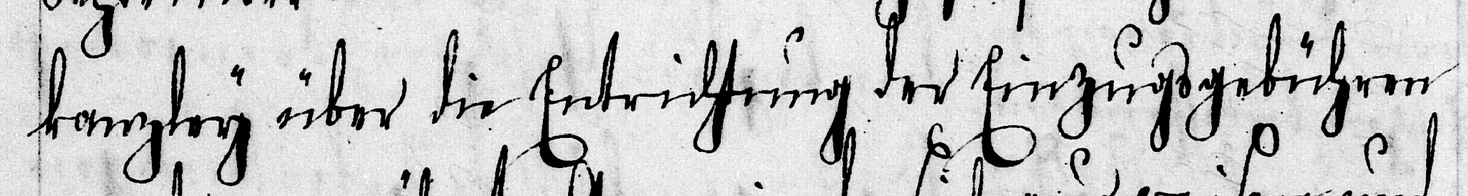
kanzley über die Entrichtung der Einzugsgebühren
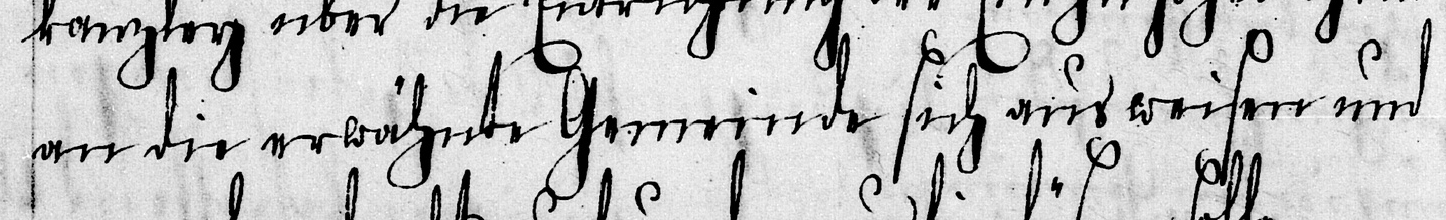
an die erwähnte Gemeinde sich ausweisen und
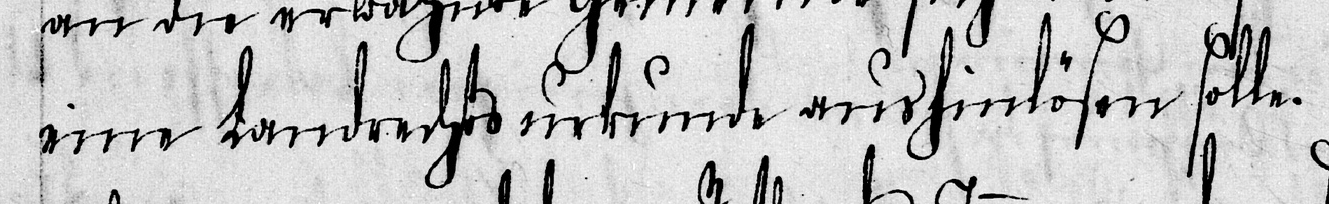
eine Landrechtsurkunde aushinlösen sol¬
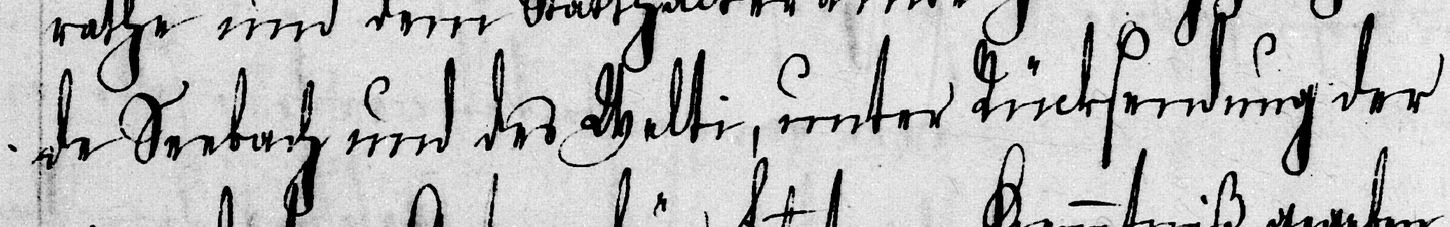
nde] Seebach und des Welti, unter Rücksendung der
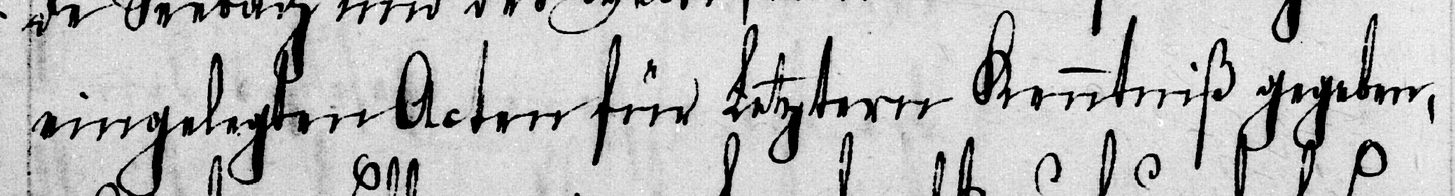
eingelegten Acten für Letztern Kenntniß gegeben,
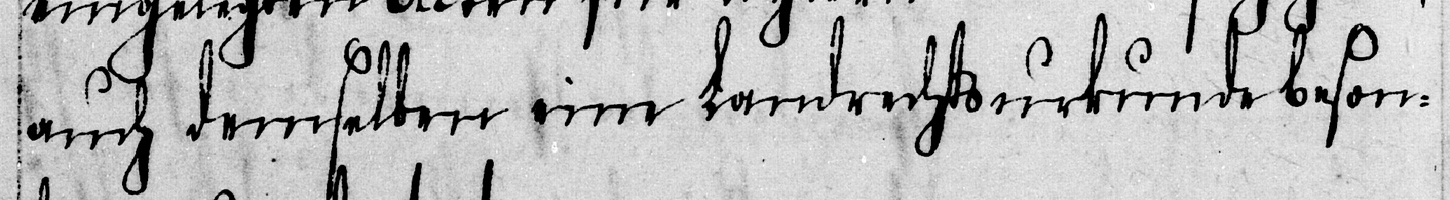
auch demselben eine Landrechtsurkunde beson¬
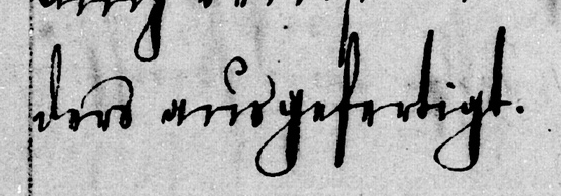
ders ausgefertigt.
